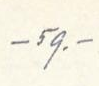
59
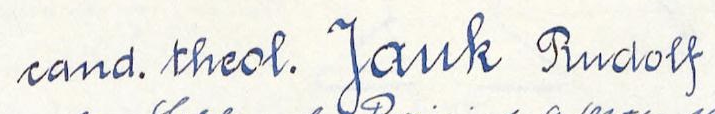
cand. theol. Jauk Rudolf
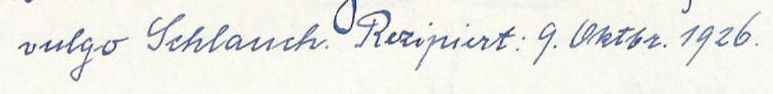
vulgo Schlauch. Rezipiert 9. Oktobr. 1926
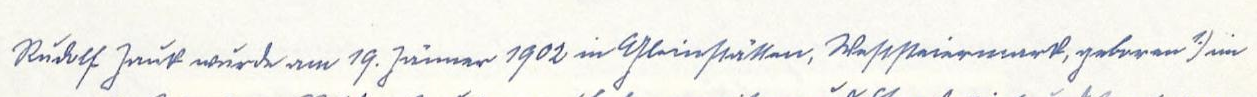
Rudolf Jauk wurde am 19. Jänner 1902 in Gleinstätten, Weststeiermark, geboren 1) im
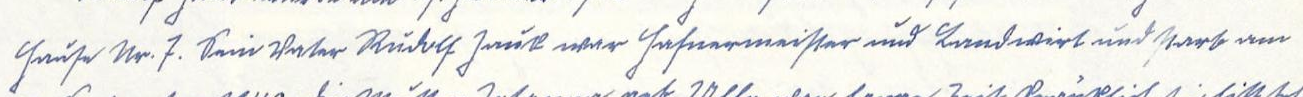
Hause Nr. 7. Sein Vater Rudolf Jauk war Hafnermeister und Landwirt und starb am
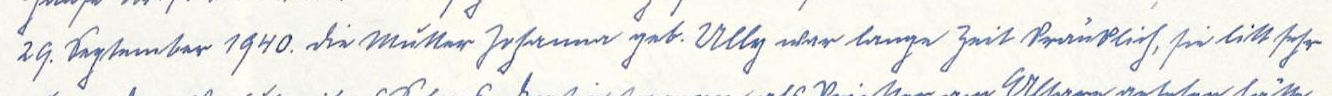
29. September 1940. Die Mutter Johanna geb. Ally war lange Zeit kränklich, sie litt sehr
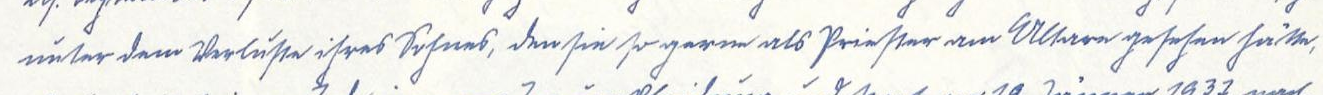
unter dem Verluste ihres Sohnes, den sie so gern als Priester am Altare gesehen hätte,
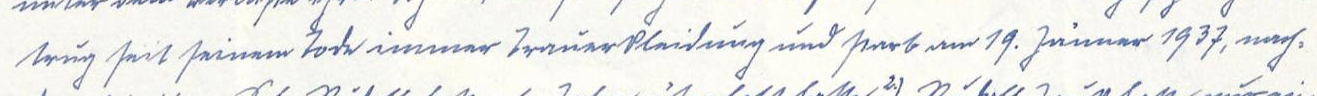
trug seit seinem Tode immer Trauerkleidung und starb am 19. Jänner 1937, nach-
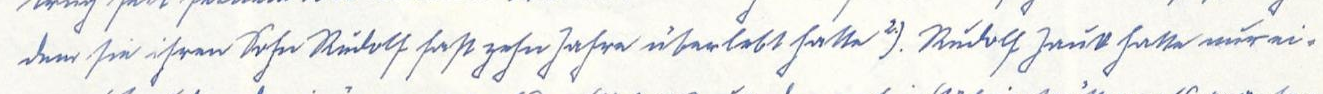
dem sie ihren Sohn Rudolf fast zehn Jahre überlebt hatte.2) Rudolf Jauch hatte nur ei-
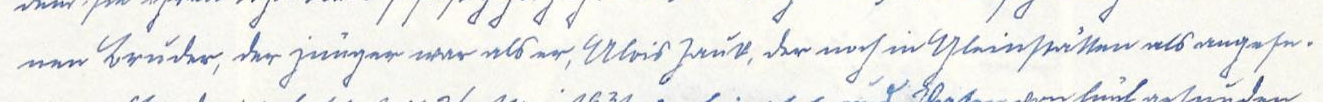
nen Bruder, der jünger war es er, Alois Jauk, der noch in Gleinstätten als angeseh-
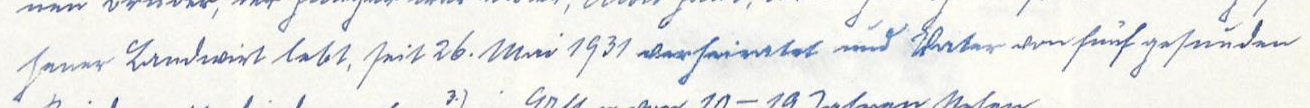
hener Landwirt lebt, seit 26. Mai 1931 verheiratet und Vater von fünf gesunden
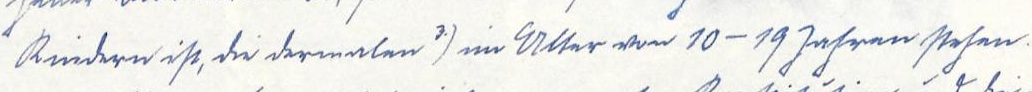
Kindern ist, die dermalen 3) im Alter von 10-19 Jahren stehen.
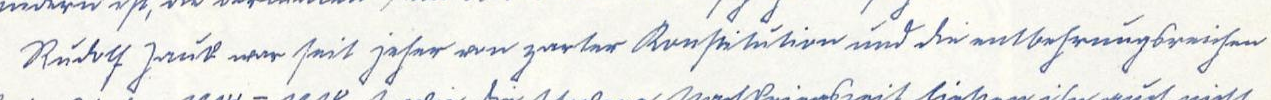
Rudolf Jauk war seit jeher von zarter Konstitution und die entbehrungsreichen
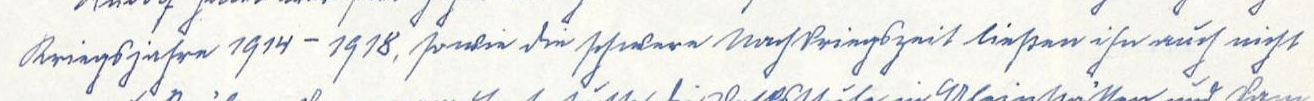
Kriegsjahre 1914-1918, sowie die schwere Nachkriegszeit ließen ihn auch nicht
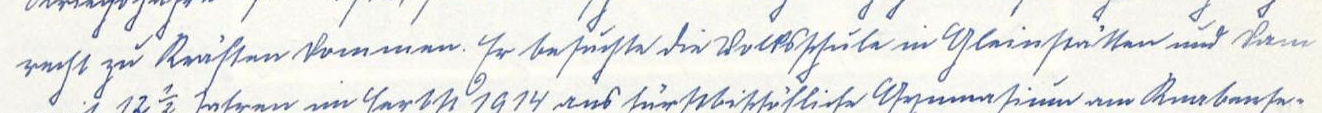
recht zu Kräften kommen. Er besuchte die Volksschule in Gleinstätten und kam
